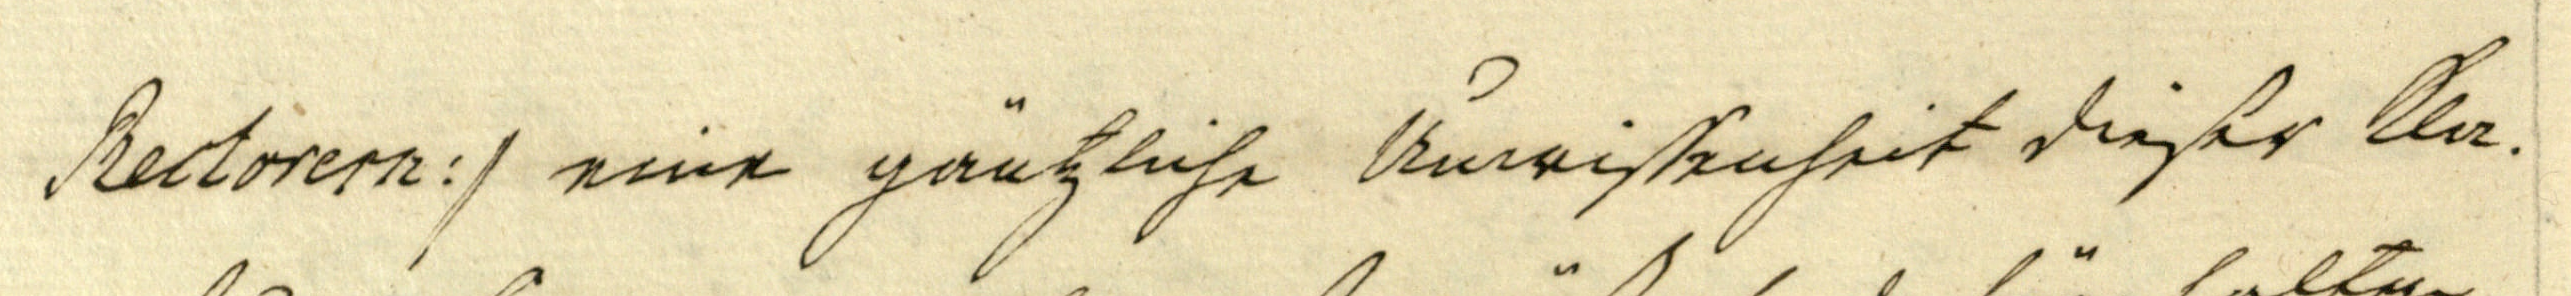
Rectorem:/ eine gäntzliche Unwissenheit dieser Kla¬
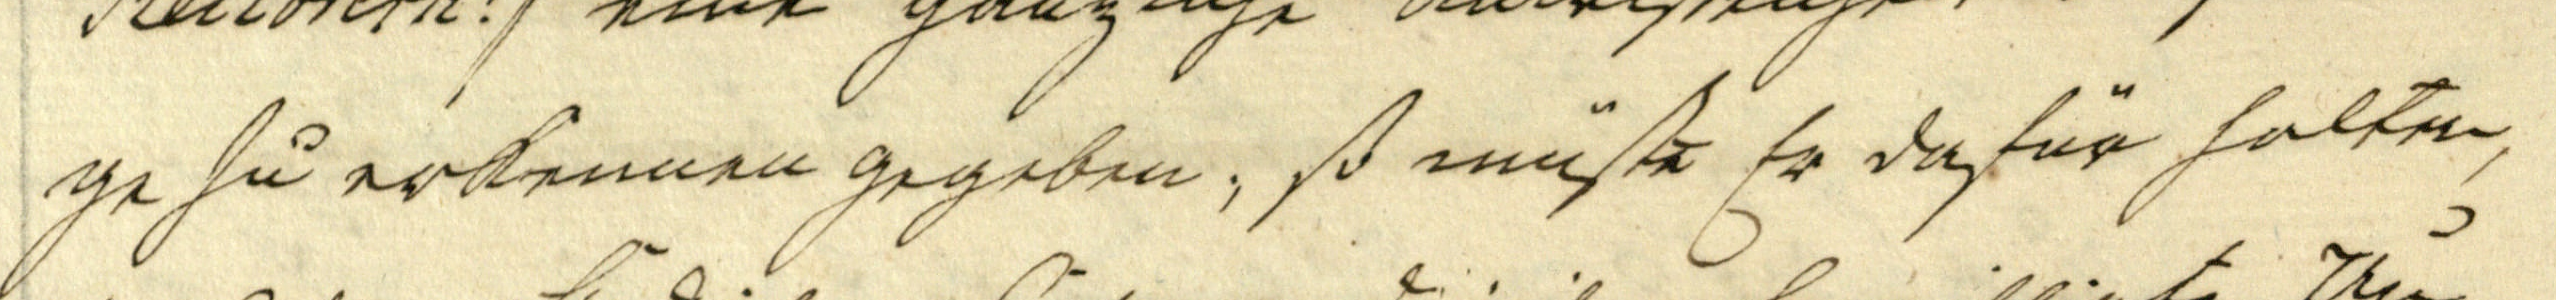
ge zu erkennen gegeben, so müsste Er dafür halten,
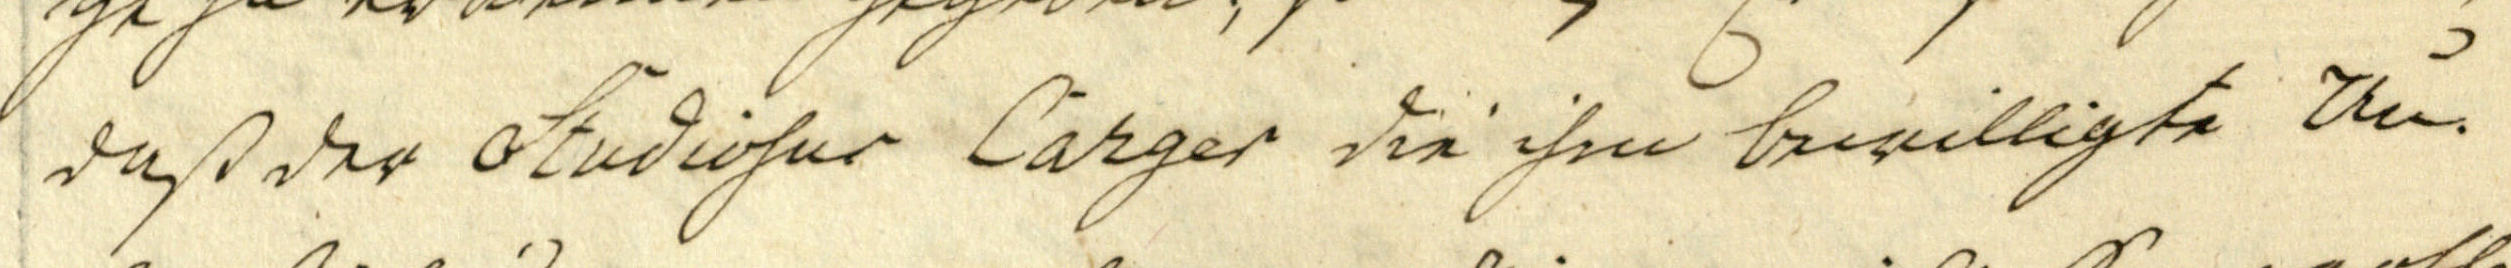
daß der Studiosus Carger die ihm bewilligte Un¬
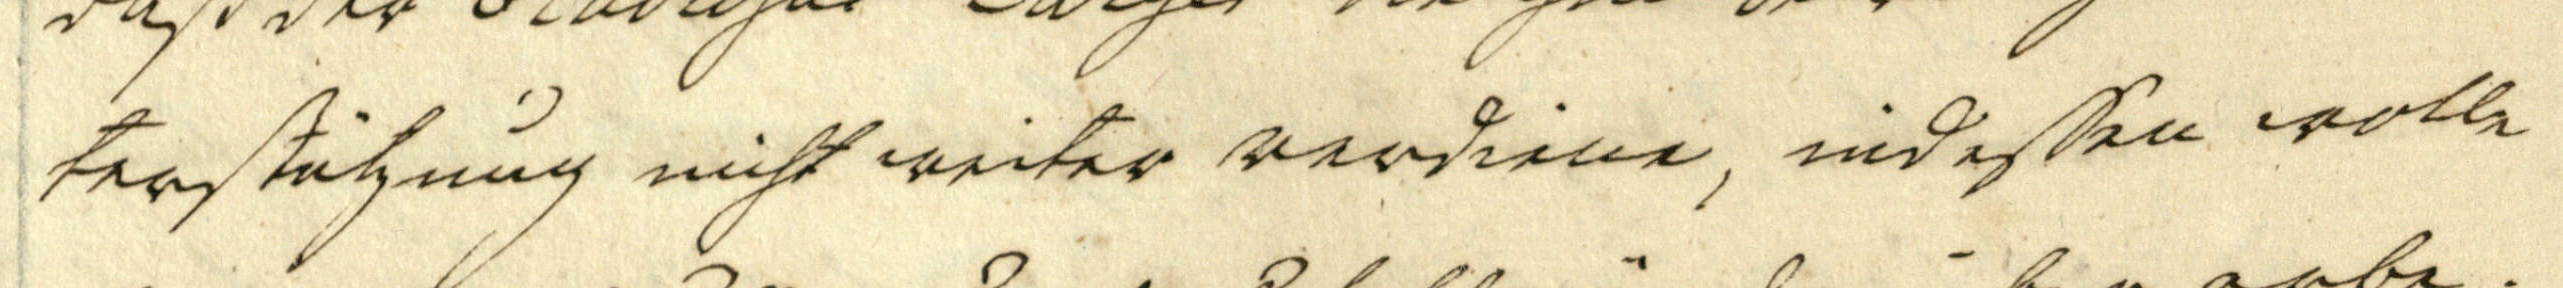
terstützung nicht weiter verdiene, indessen wolle
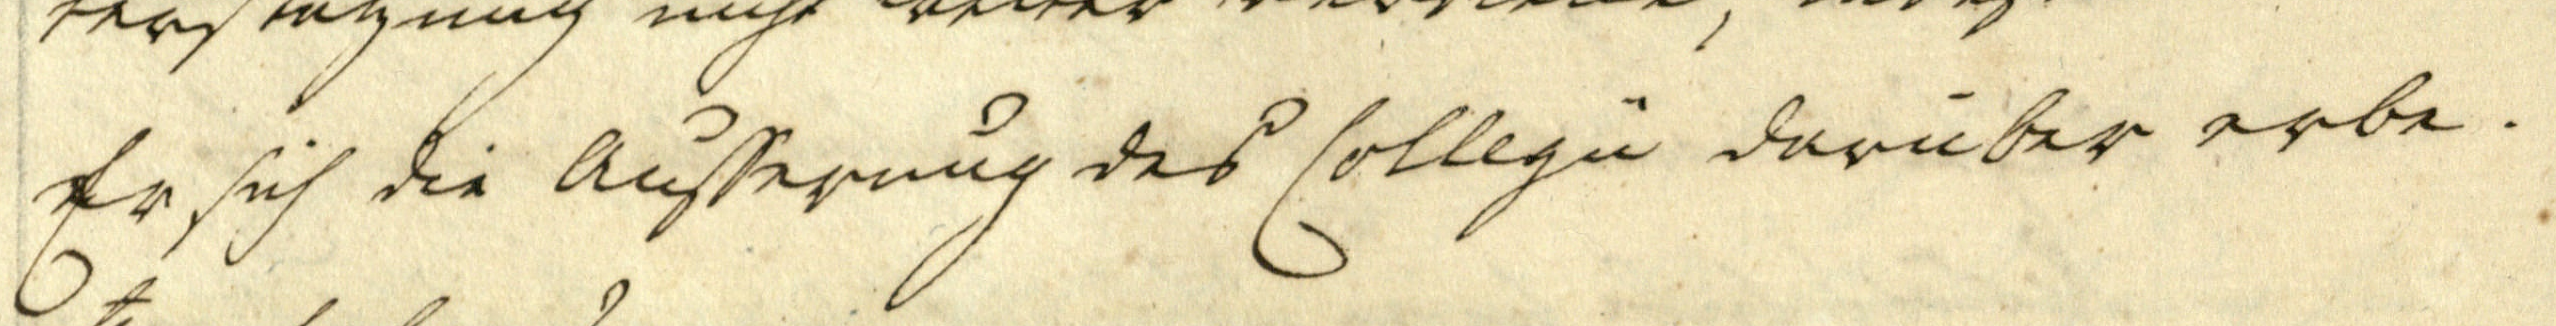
Er sich die Äusserung des Collegii darüber erbe¬
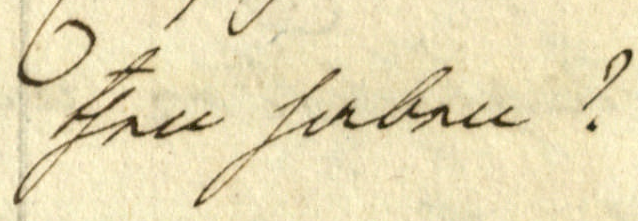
then haben?
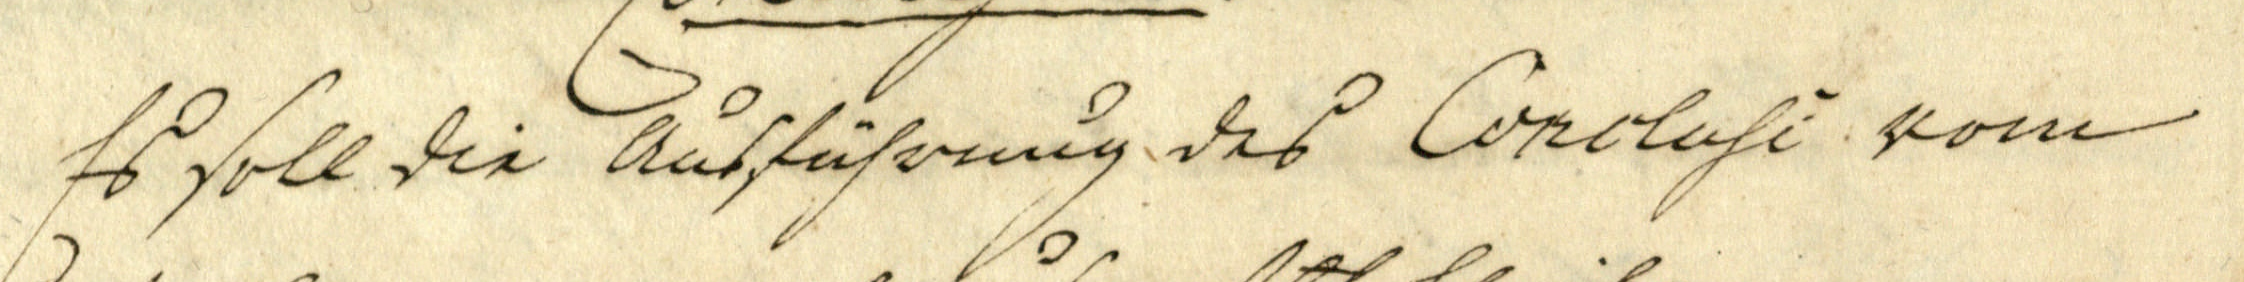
Es soll die Ausführung des Conclusi vom
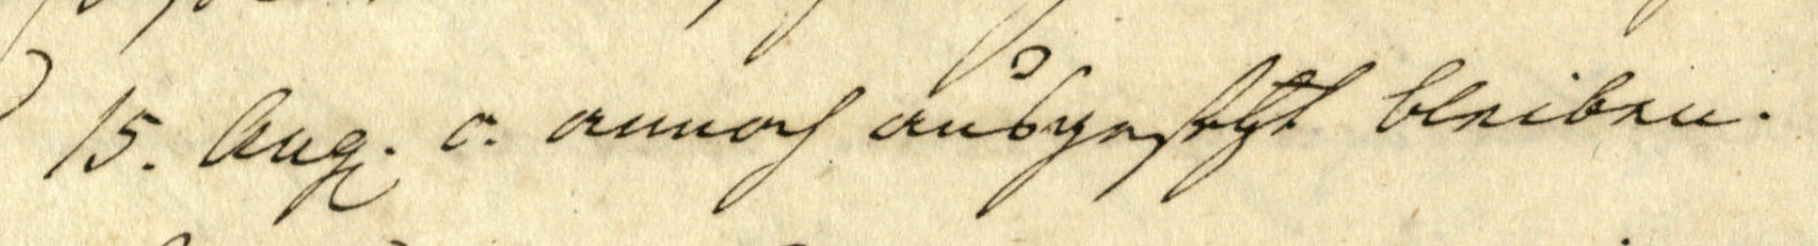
15. Aug. c. annoch ausgesetzt bleiben.
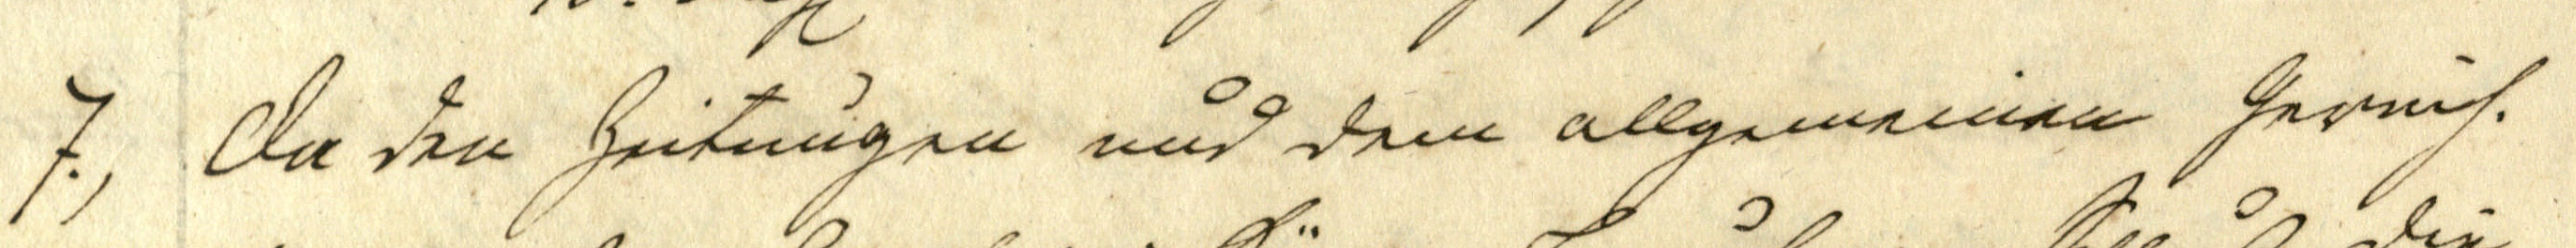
7., Da den Zeitungen und dem allgemeinen Gerüch¬
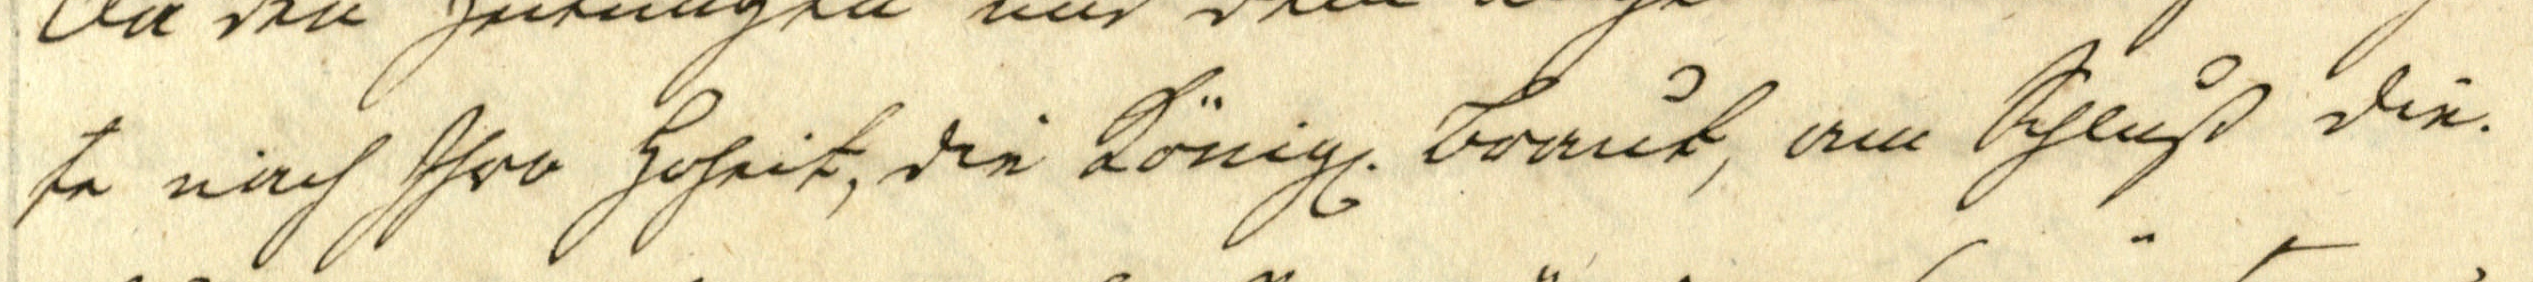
te nach Ihro Hoheit, die Königl. Braut, am Schluß die¬
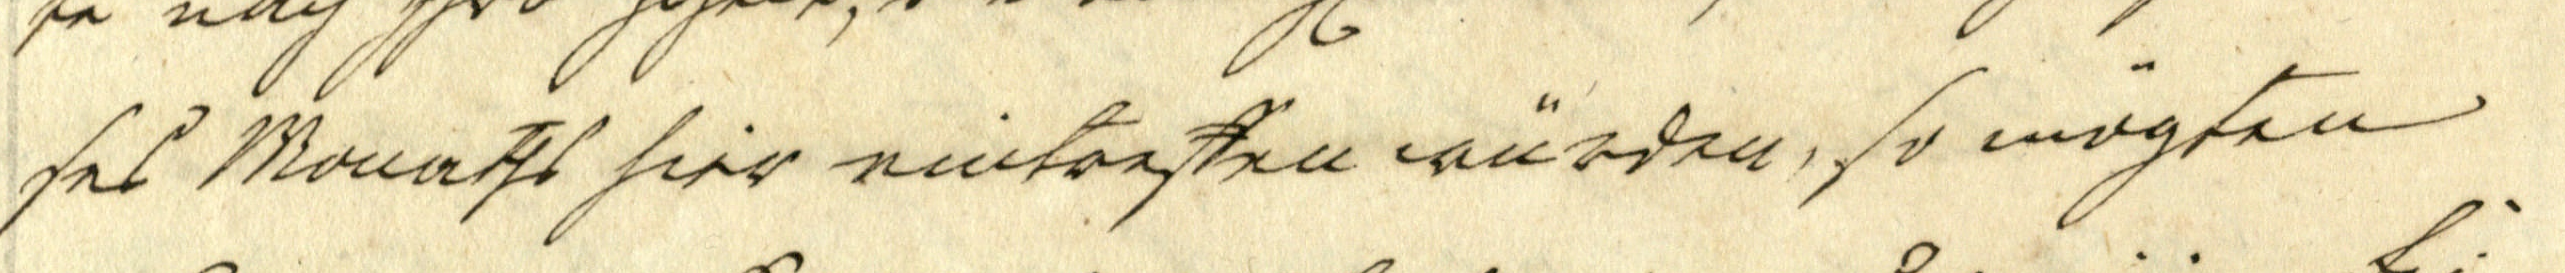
ses Monaths hier eintreffen würden, so mögten
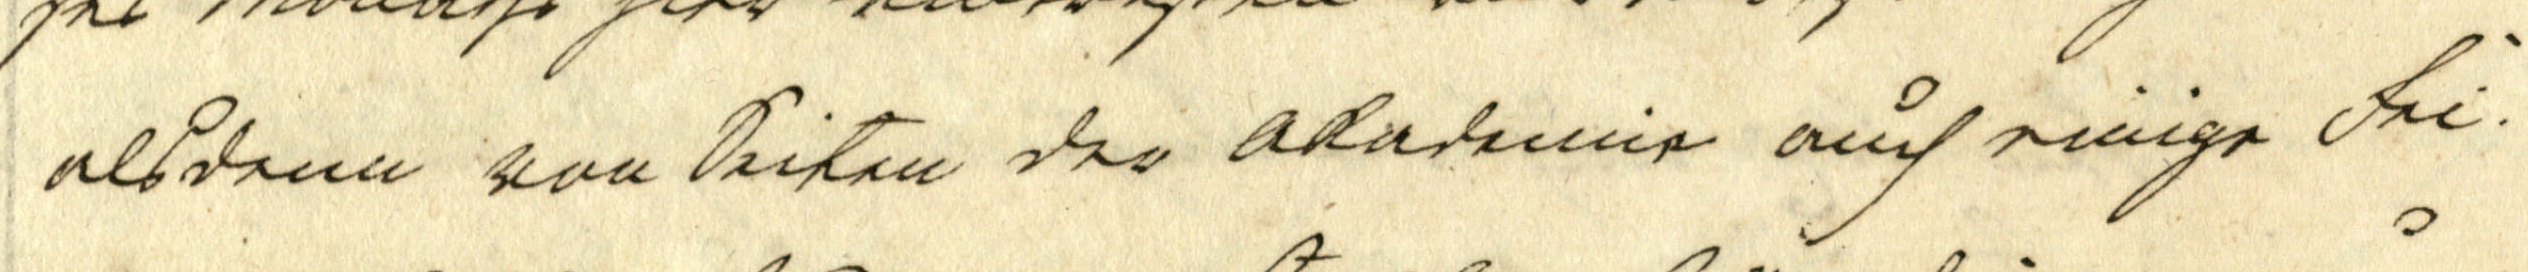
alsdenn von Seiten der Akademie auch einige Fei¬
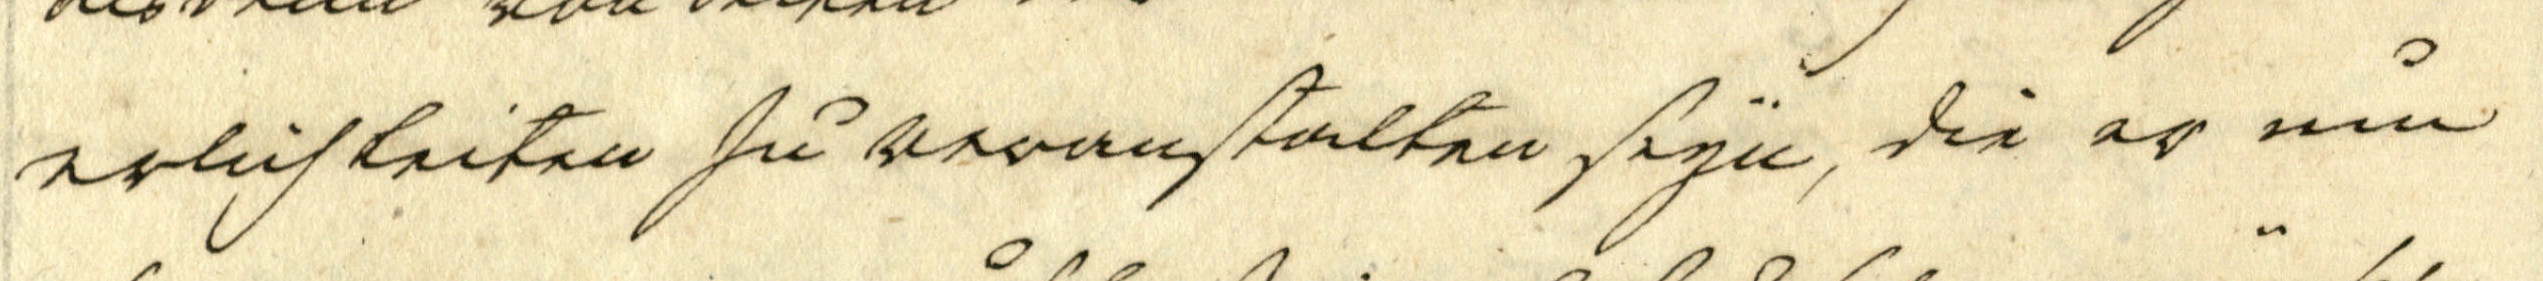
erlichkeiten zu veranstalten seÿn, die er um
